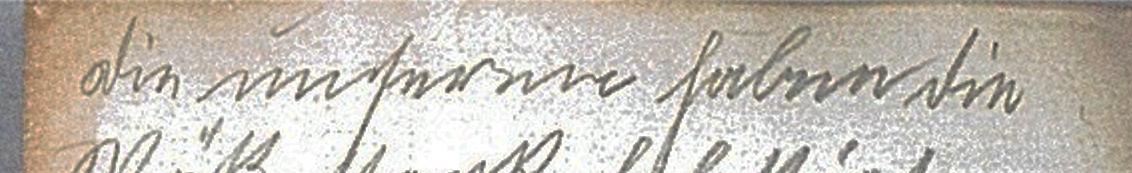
die unseren haben die
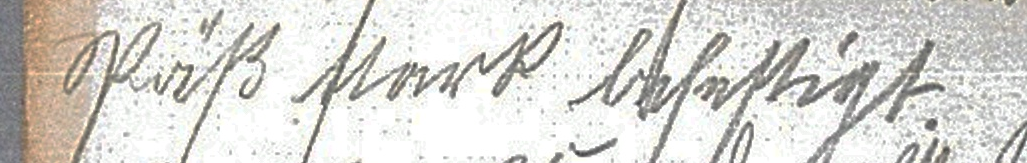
Päß stark befestigt.
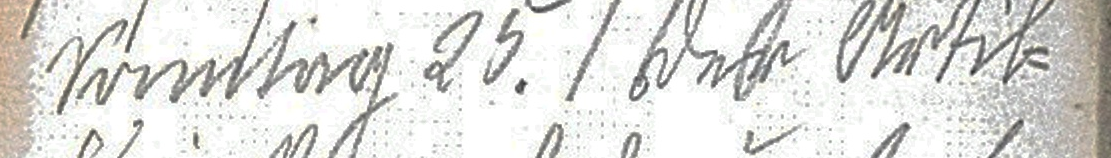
Sonntag 25. Der Artil-
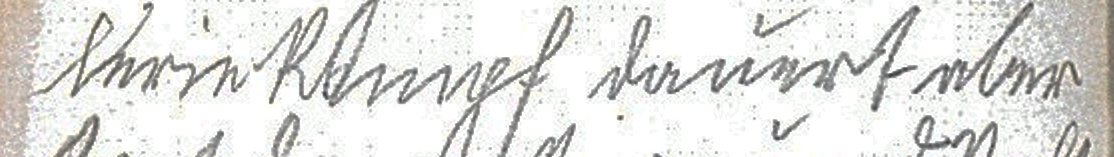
lerie Kampf dauert aber
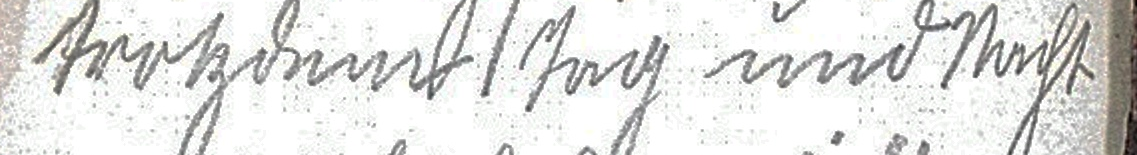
trotzdem Tag und Nacht
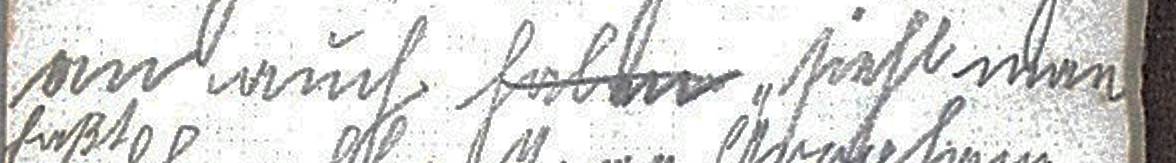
an auch sieht man
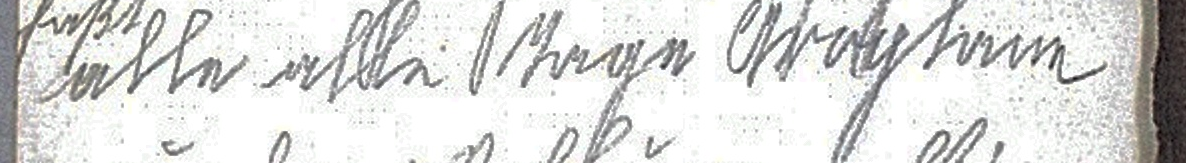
faßt alle alle Tage Äroplane
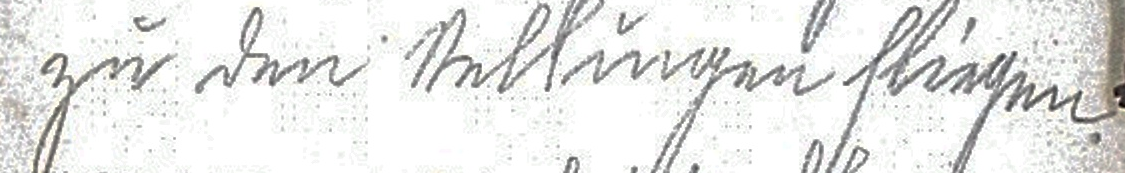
zu den Stellungen fliegen.
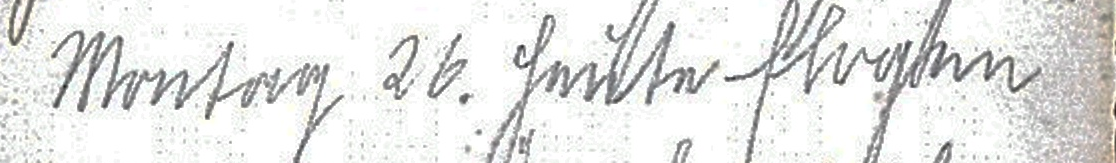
Montag 26. heute flogen
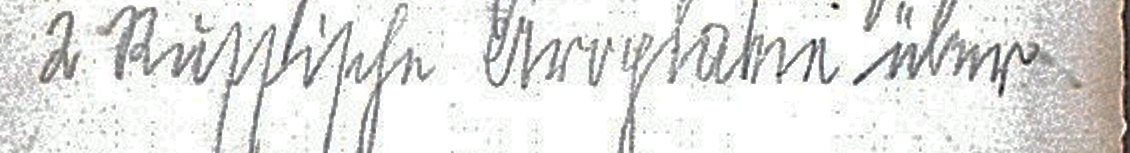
2 Russische Äroplane über
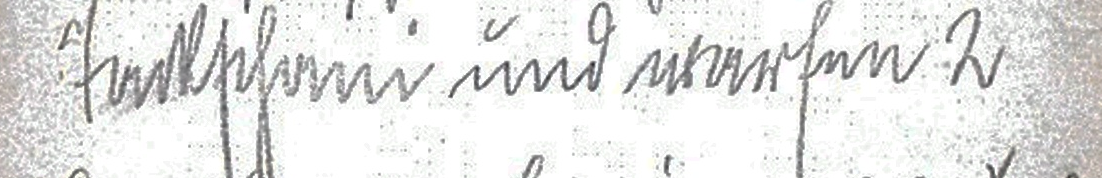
Kartschani und warfen 1
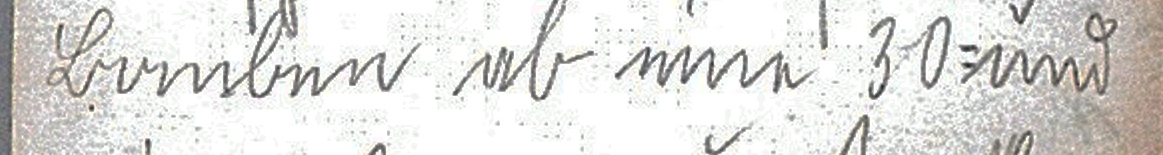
Bomben ab in 30 und
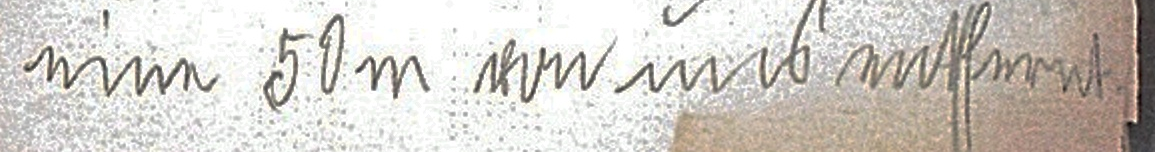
min 50 m von uns entfernt.
